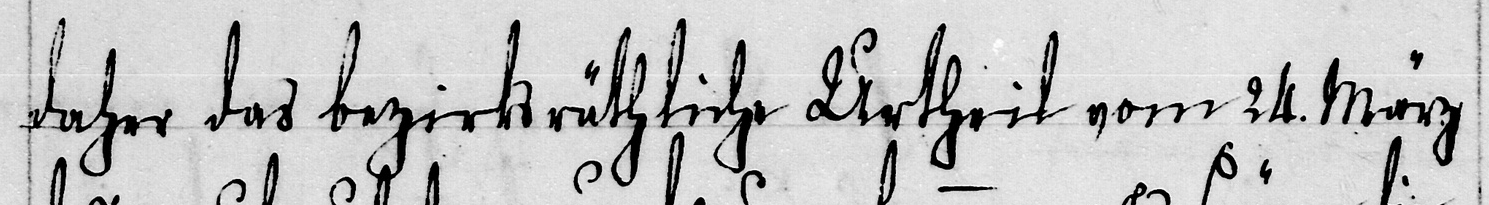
daher das bezirksräthliche Urtheil vom 24. März
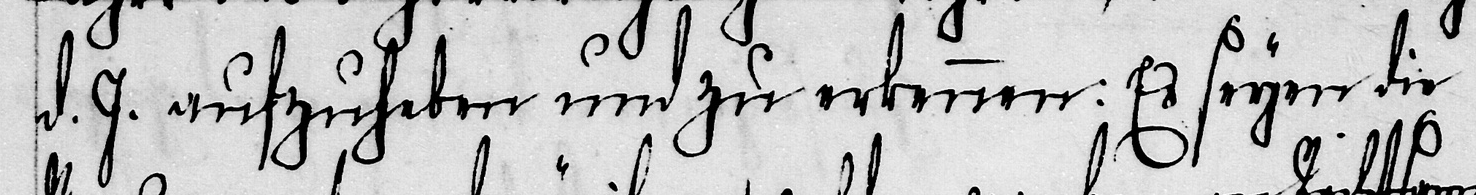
d. J. aufzuheben und zu erkennen: Es seyen die
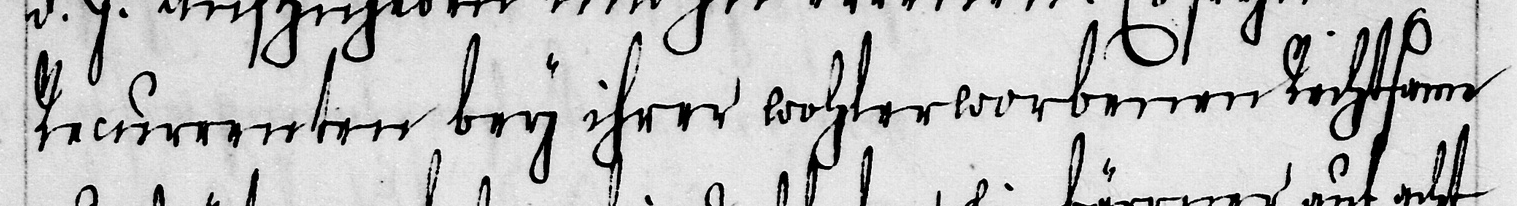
Recurrenten bey ihrer wohlerworbenen Rechtsame
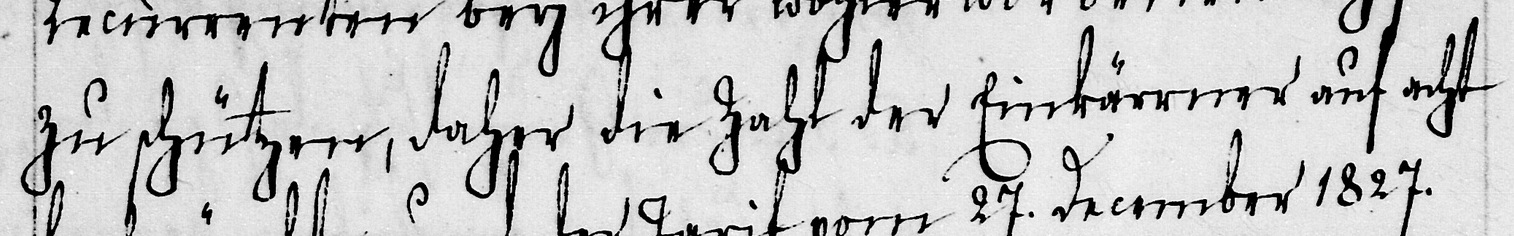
zu schützen, daher die Zahl der Einkärrner auf acht
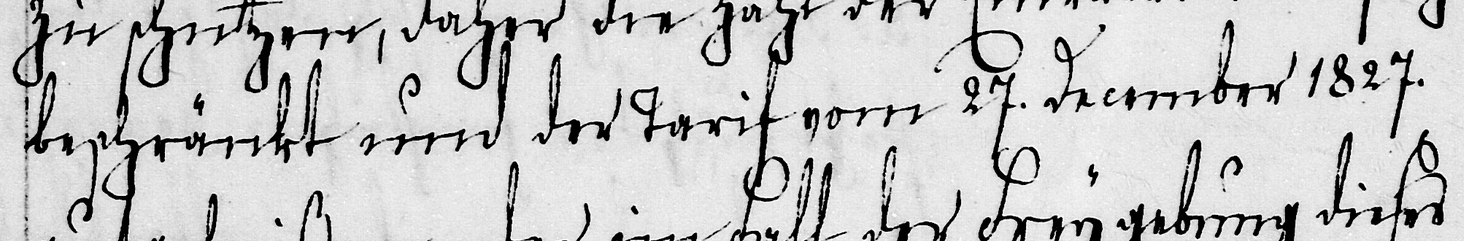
beschränkt und der Tarif vom 27. December 1827.
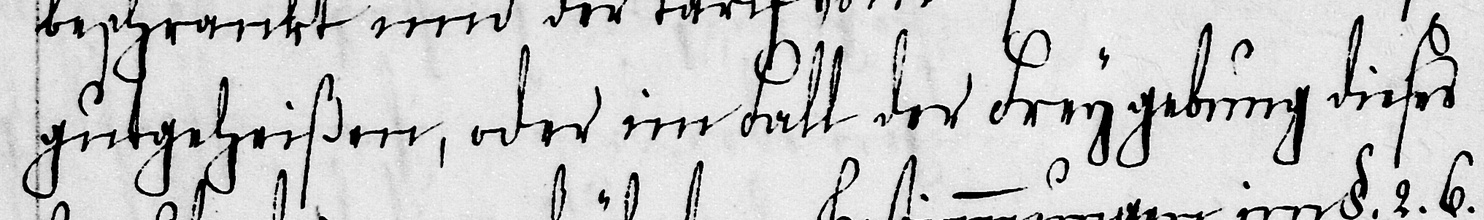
gutgeheißen, oder im Fall der Freygebung dieses
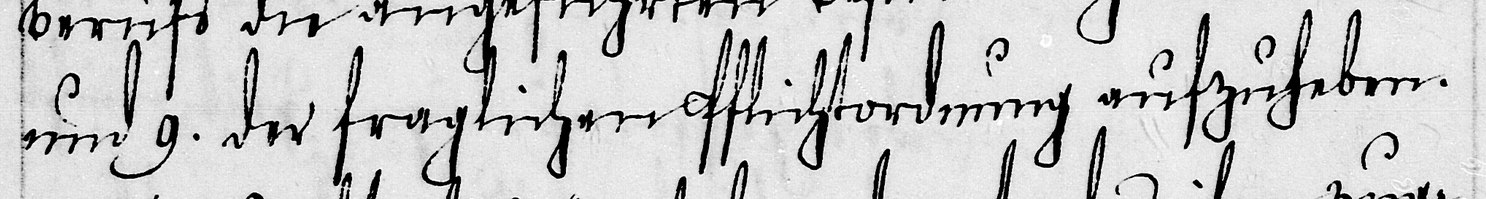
und 9. der fraglichen Pflichtordnung aufzuheben.
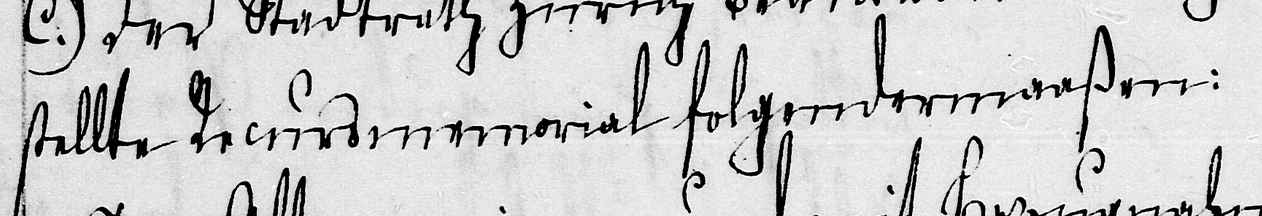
tellte Recursmemorial folgendermaaßen:
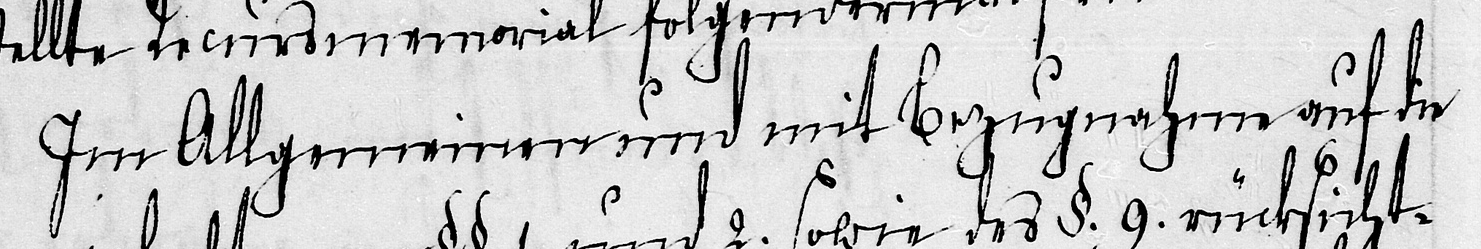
Im Allgemeinen und mit Bezugnahme auf die
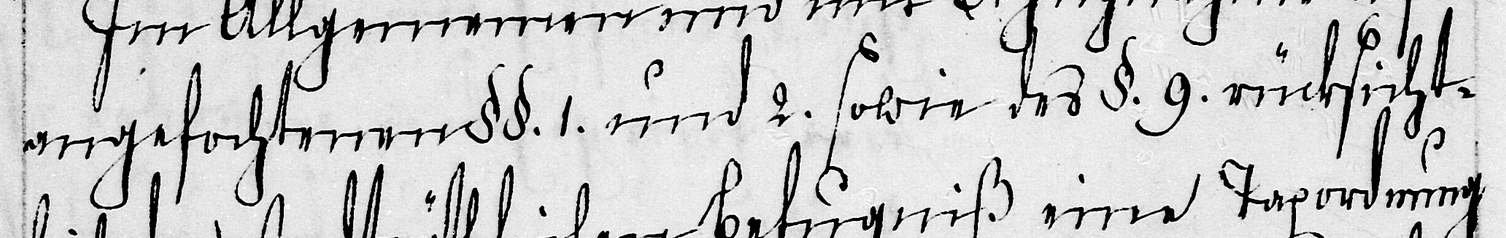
angefochtenen §§. 1. und 2. sowie des §. 9. rücksicht¬
